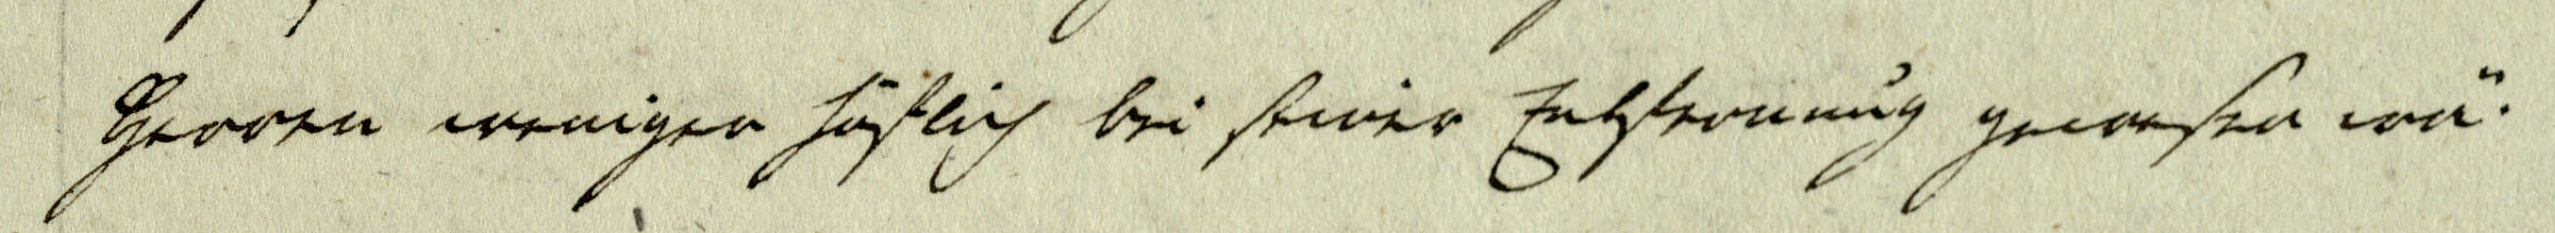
Herren weniger höflich bei seiner Entfernung gewesen wä¬
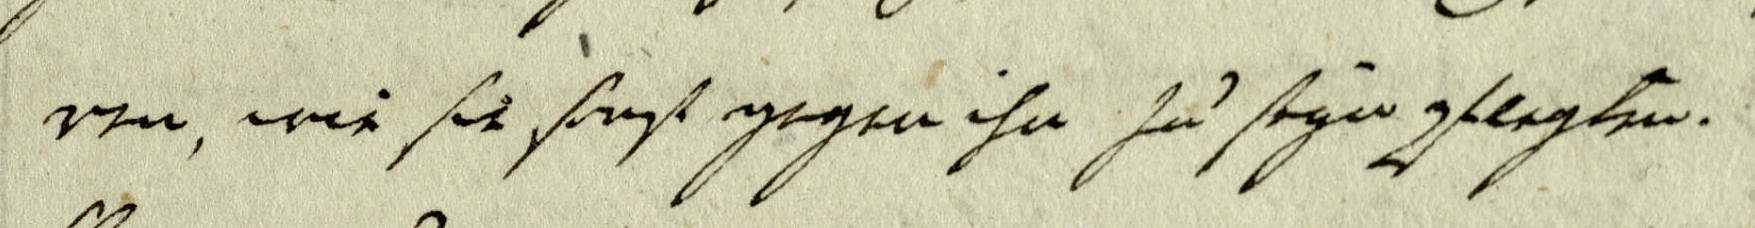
ren, wie sie sonst gegen ihn zu seÿn pflegten.
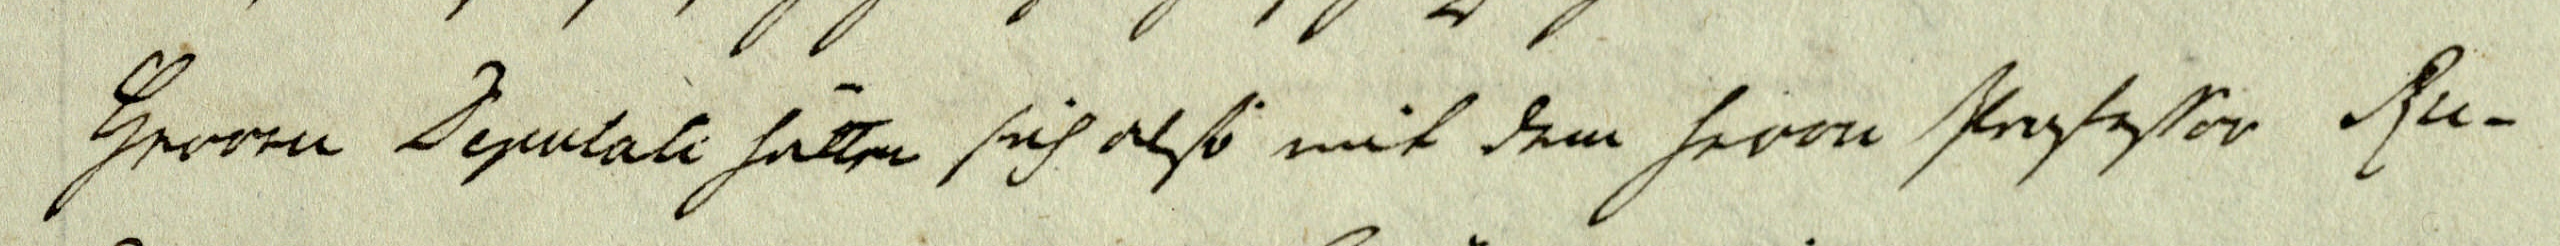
Herren Deputati hätten sich also mit dem Herrn Professor Ru¬
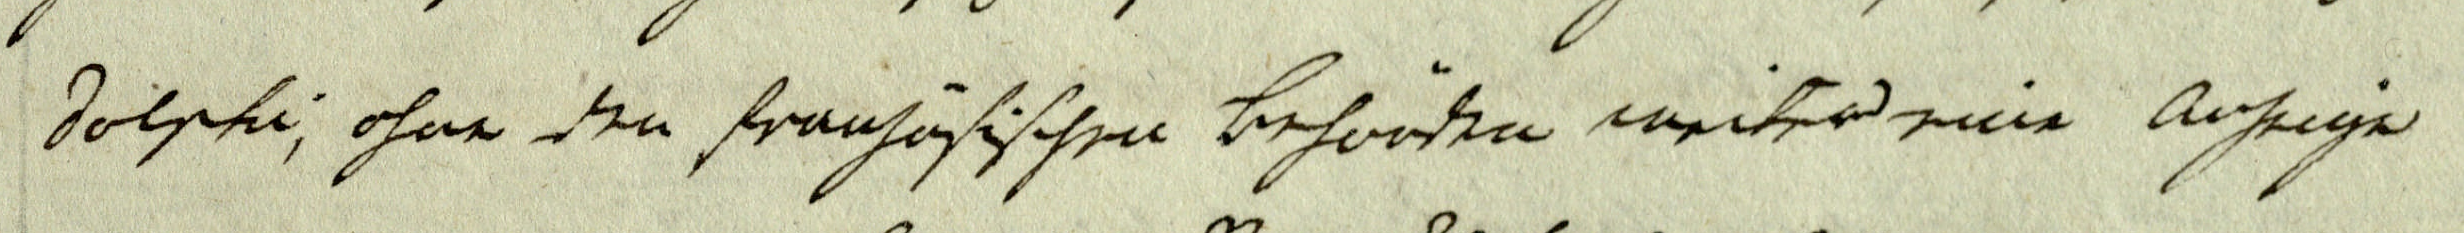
dolphi, ohne den Französischen Behörden weiter eine Anzeige
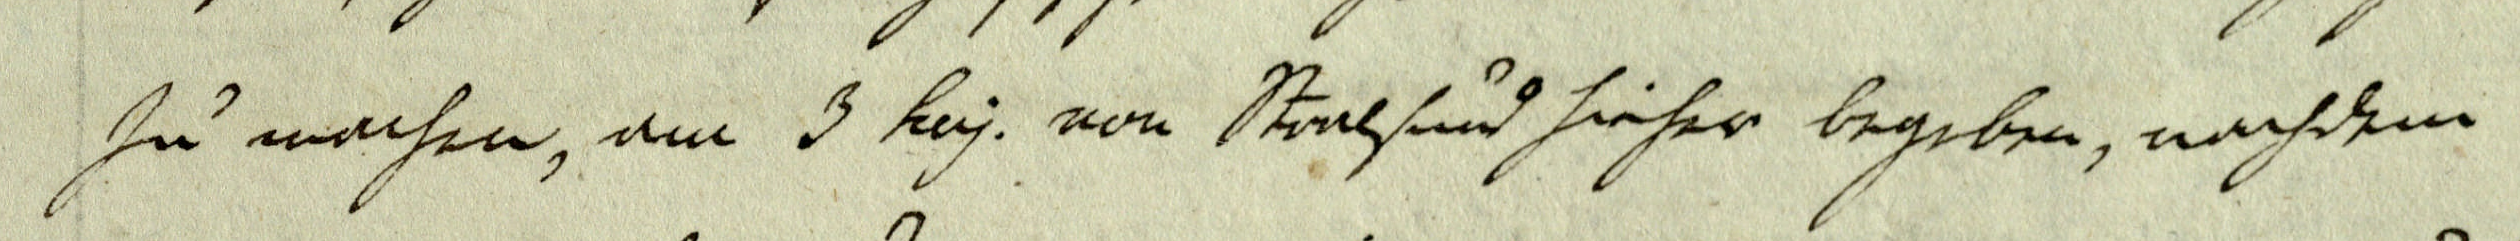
zu machen, am 3 huj. von Stralsund hieher begeben, nachdem
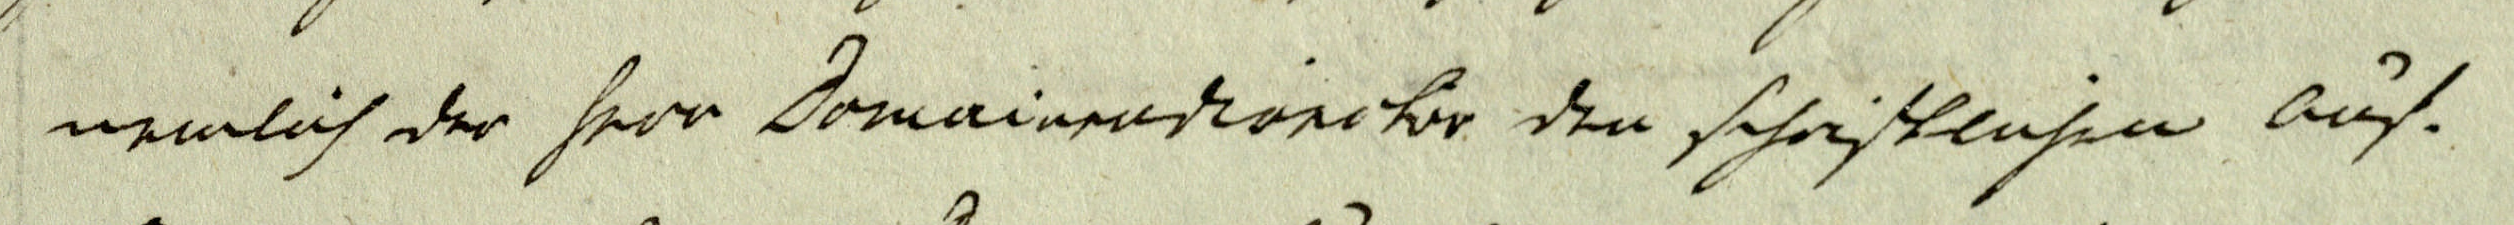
nemlich der Herr Domainendirector den schriftlichen Auf¬
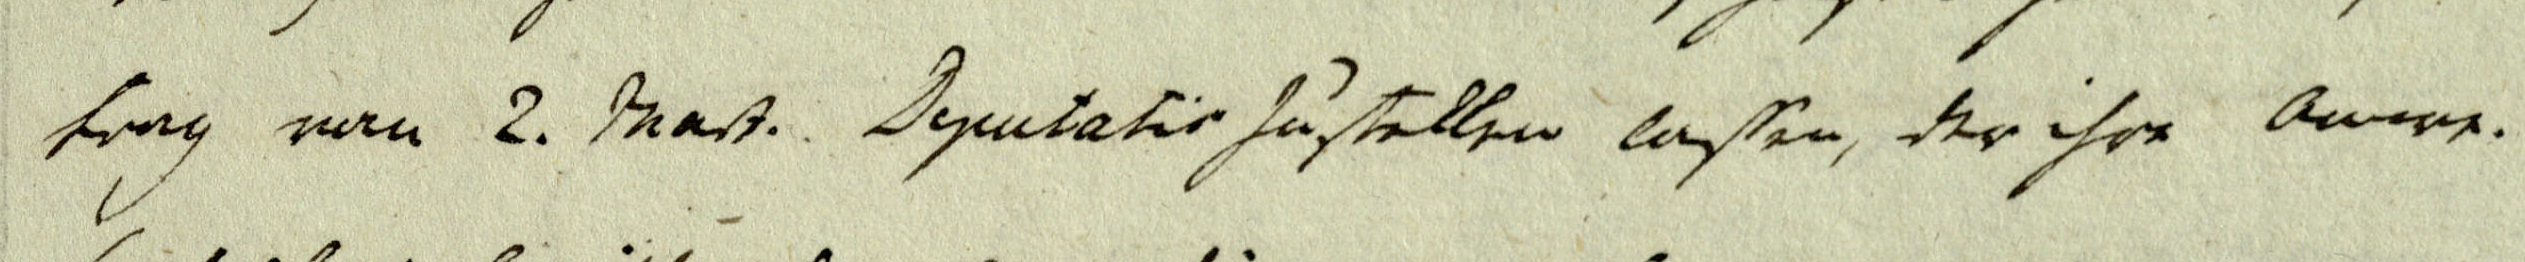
trag vom 2. Mart. Deputatis zustellen lassen, der ihre Anwe¬
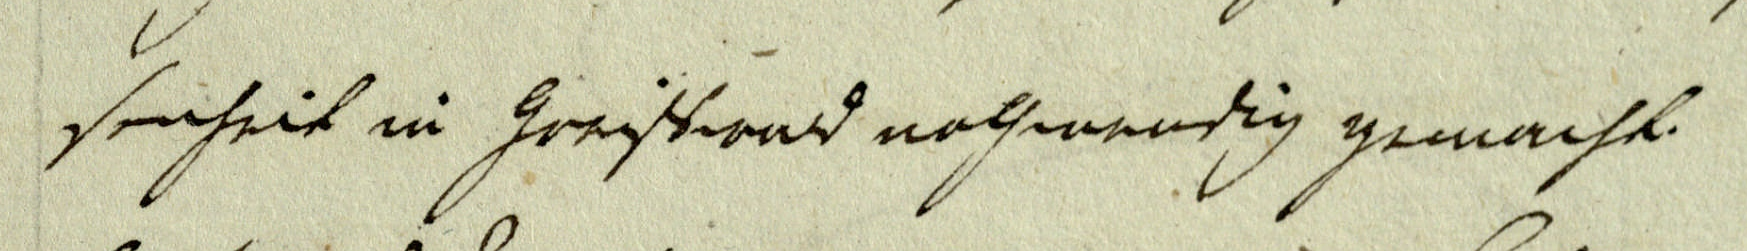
senheit in Greifswald nothwendig gemacht.
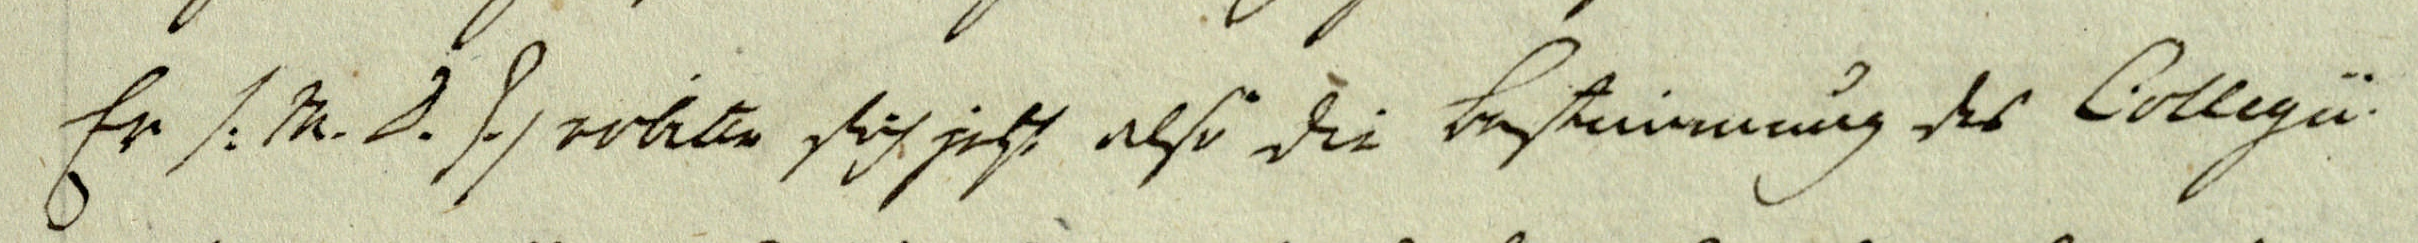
Er /. M. D. R. / erbitte sich jetzt also die Bestimmung des Collegii
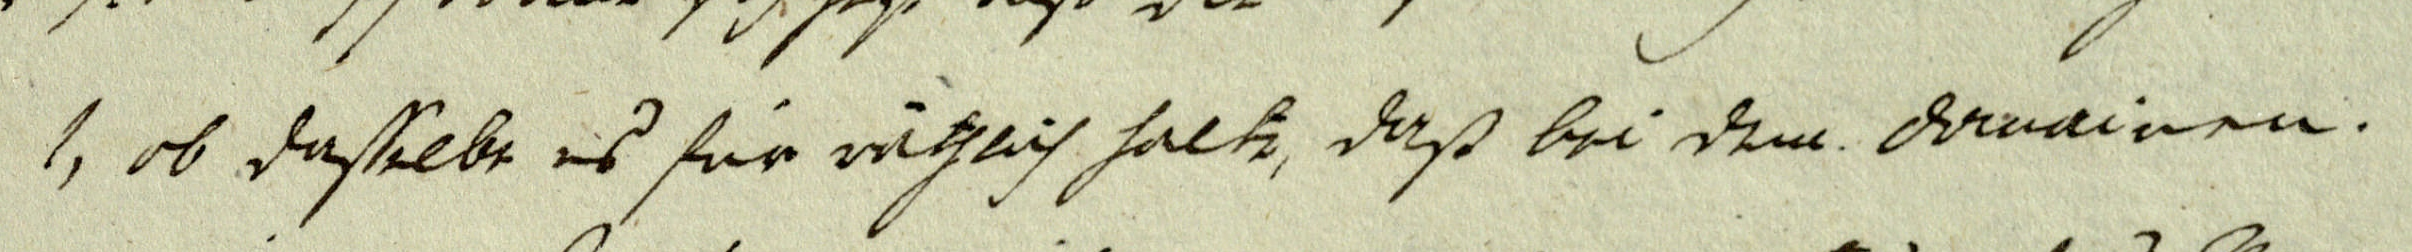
1, ob dasselbe es für räthlich halte, daß bei dem Domainen¬
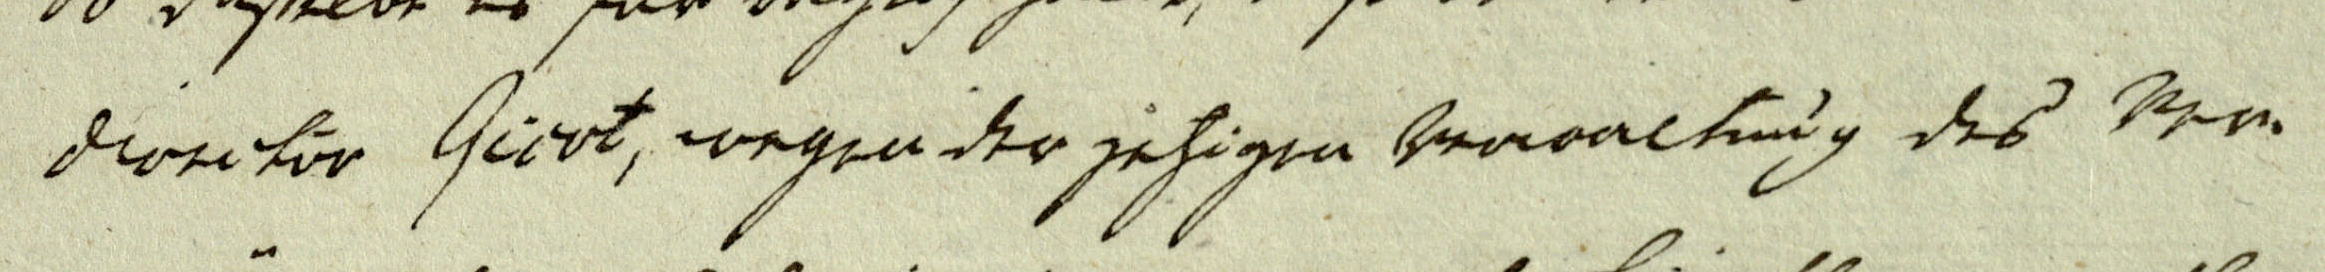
director Ricot, wegen der jetzigen Verwaltung des Ver¬
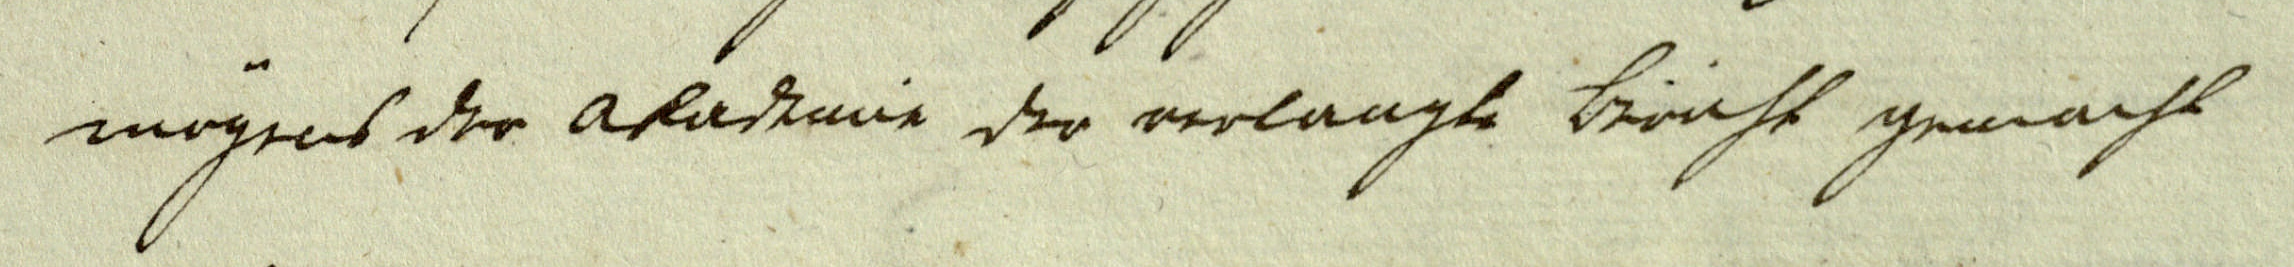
mögens der Akademie der verlangte Bericht gemacht
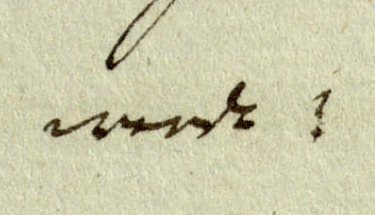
werde?
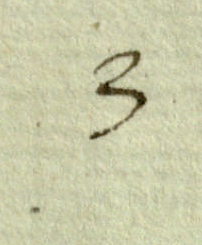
2,
